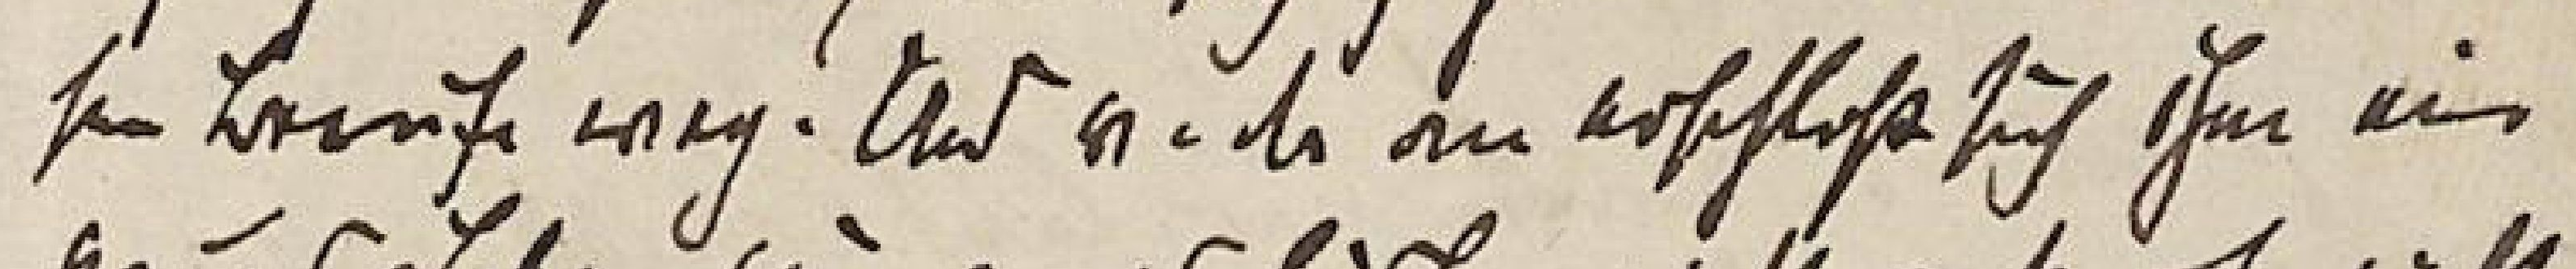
sm Berufe weg. Und v. da an erschloß sich ihm ein
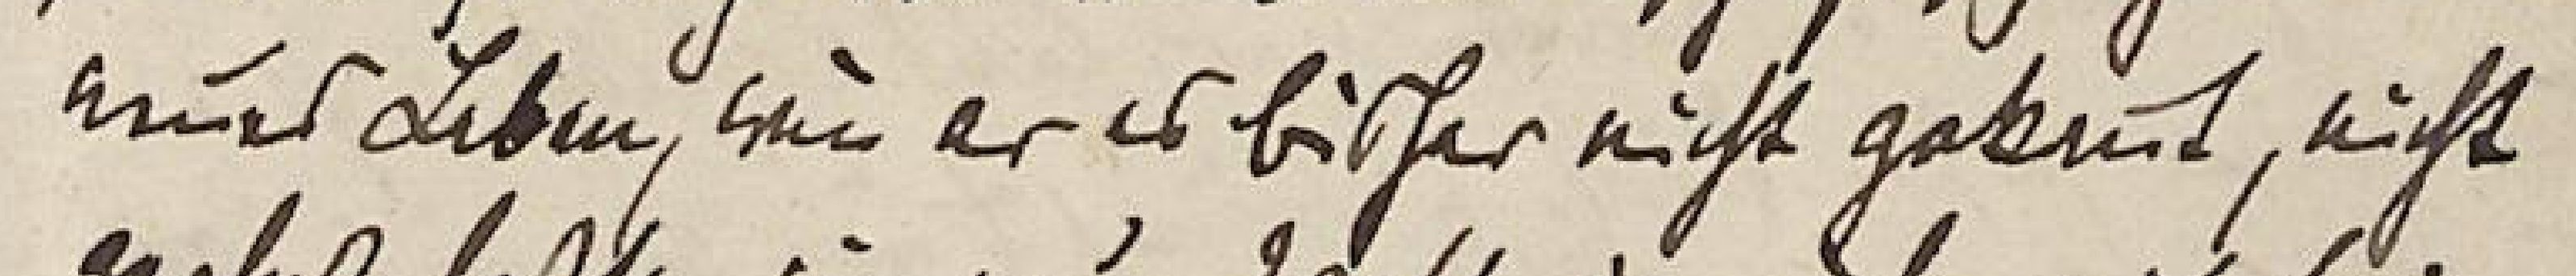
neues Leben, wie er es bisher nicht gekant, nicht
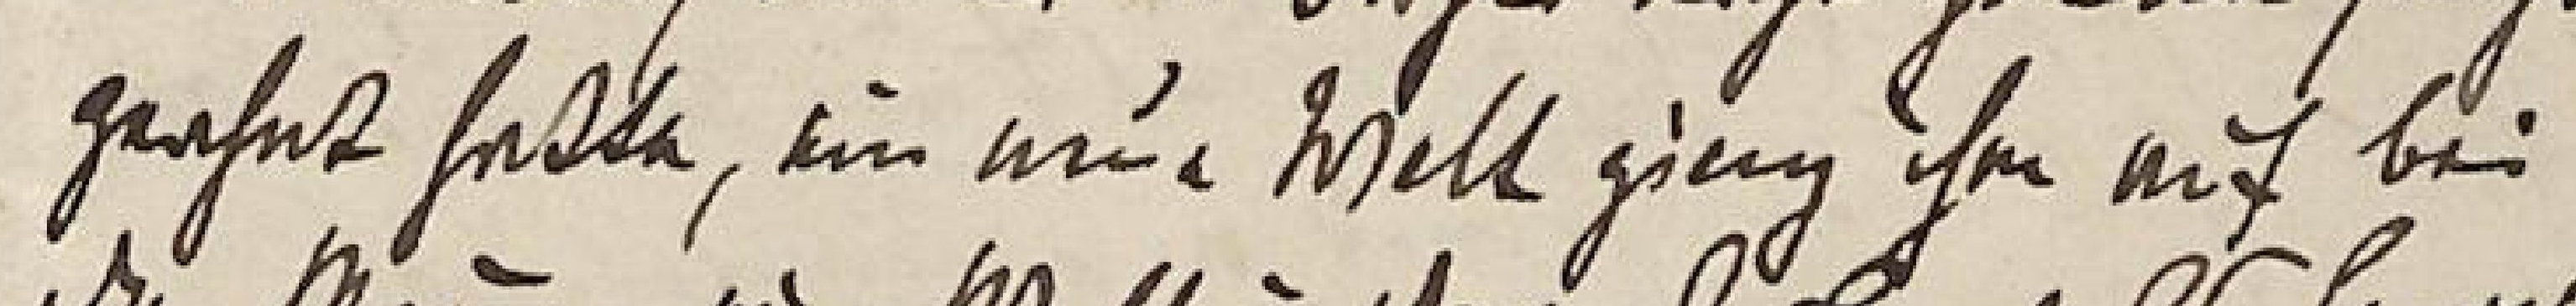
geahnt hatte, eine neue Welt ging ihm auf bei
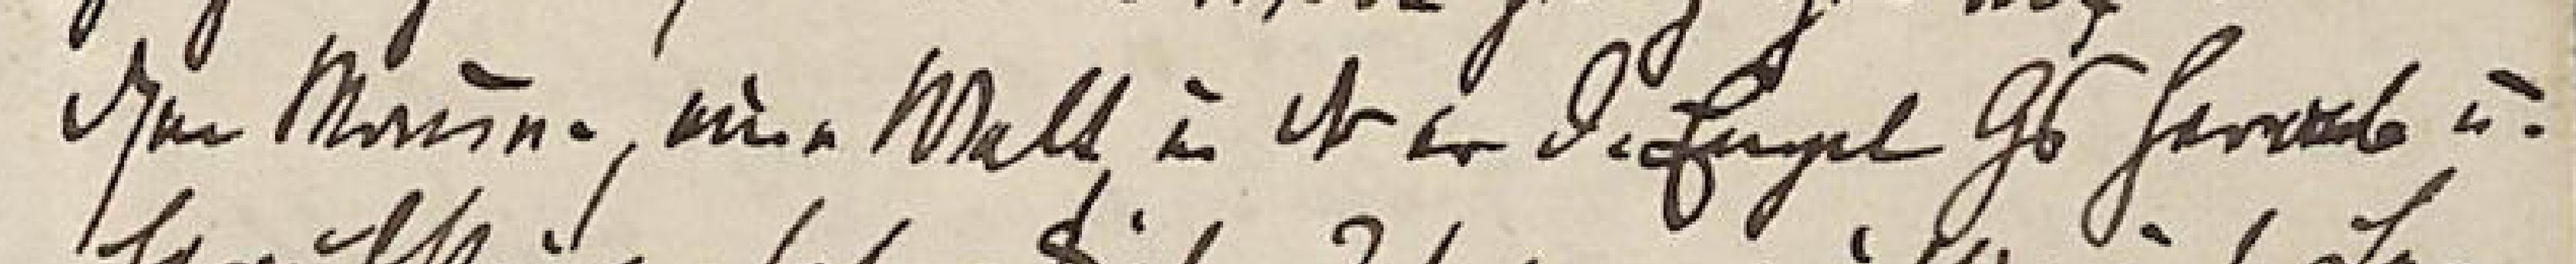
dsm Mann, eine Welt in dr er die Engel Gs herab u.
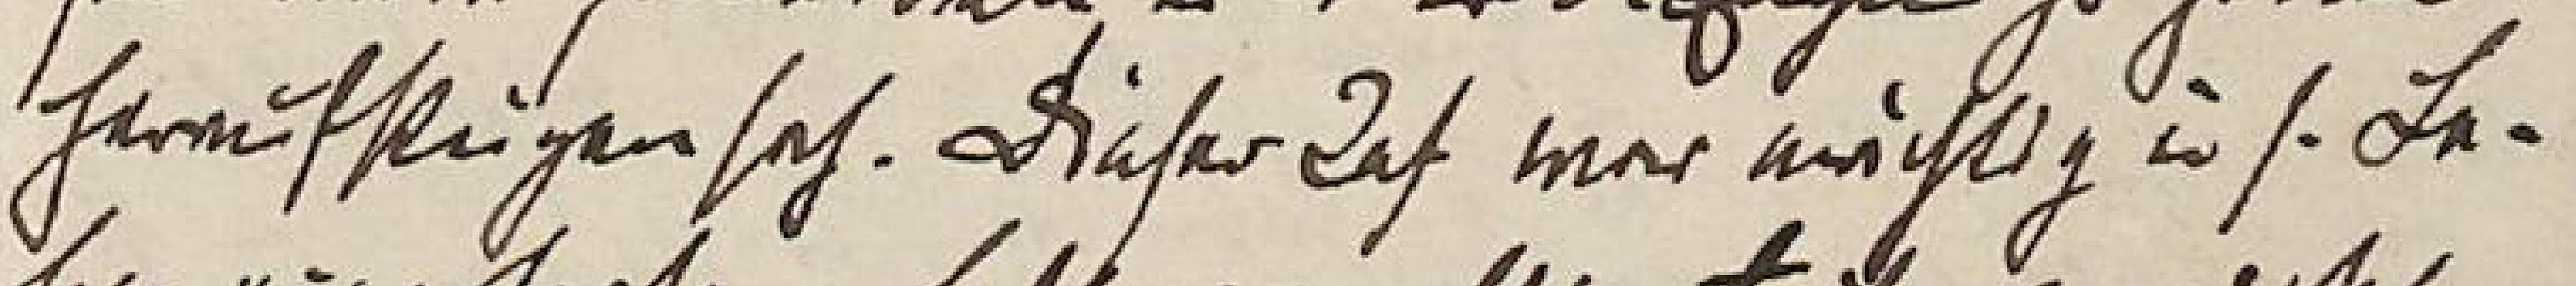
heraufsteigen sah. Dieser Jes. war mächtig in s. Le¬
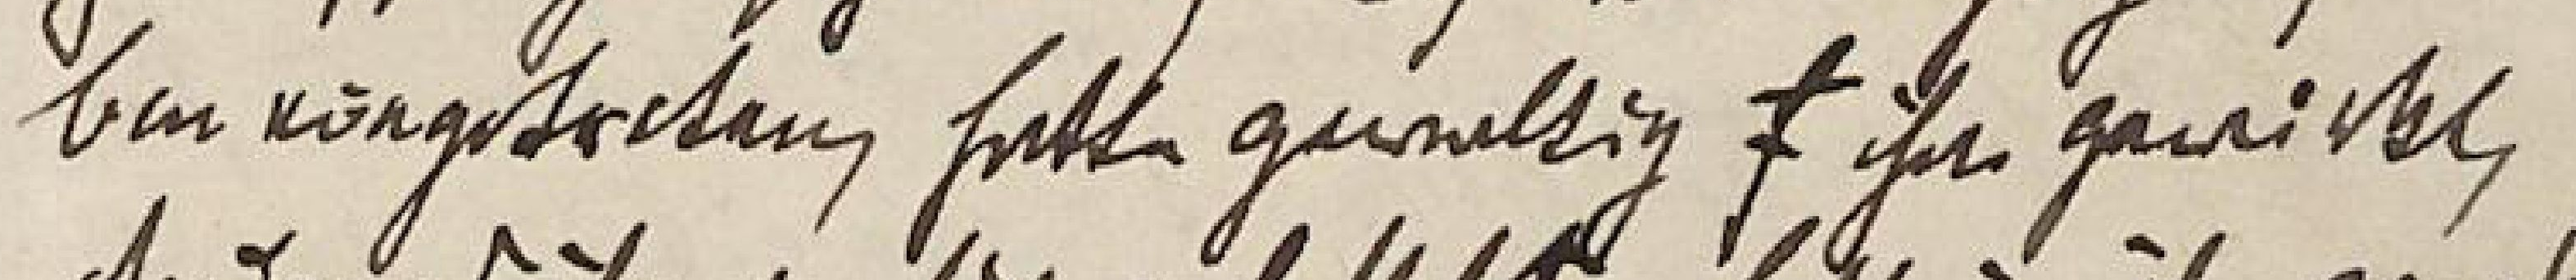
ben eingetreten, hatte gewaltig f. ihn gewirkt,
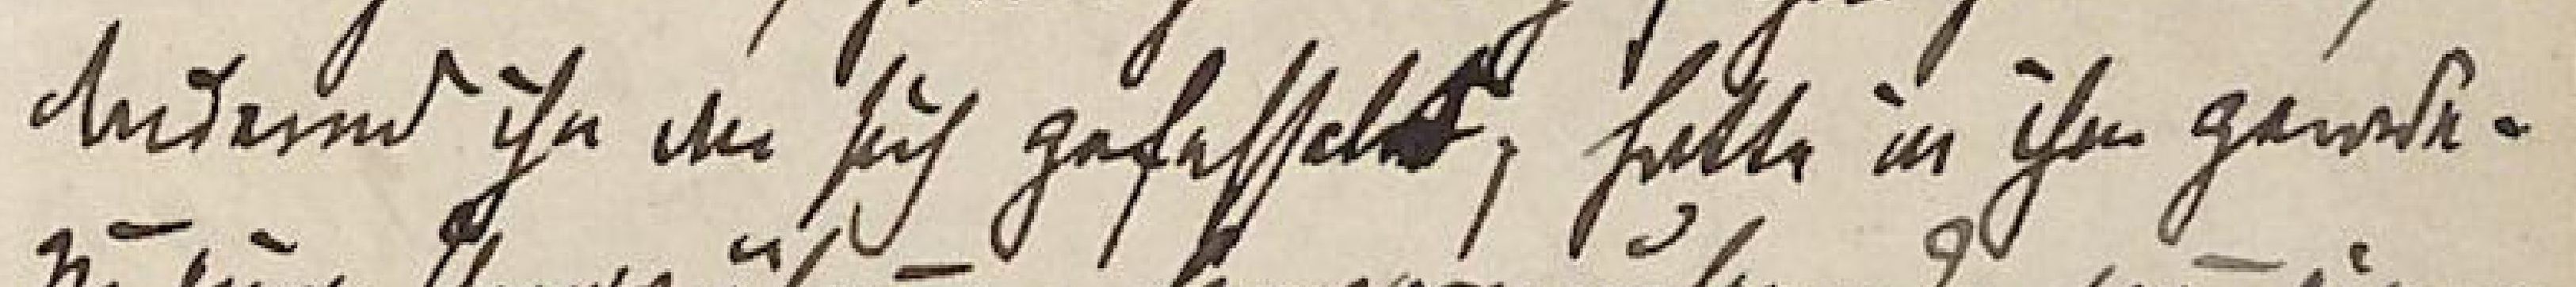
dauernd ihn an sich gefesselt, hatte in ihm gerade¬
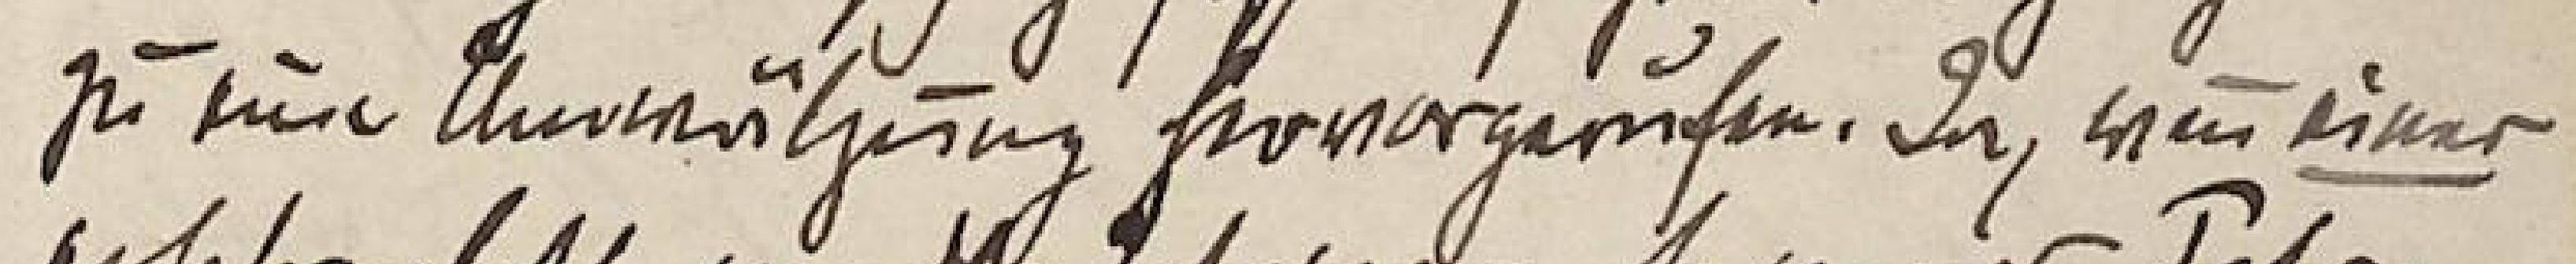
zu eine Umwälzung hervorgerufen. Ja, wen einer
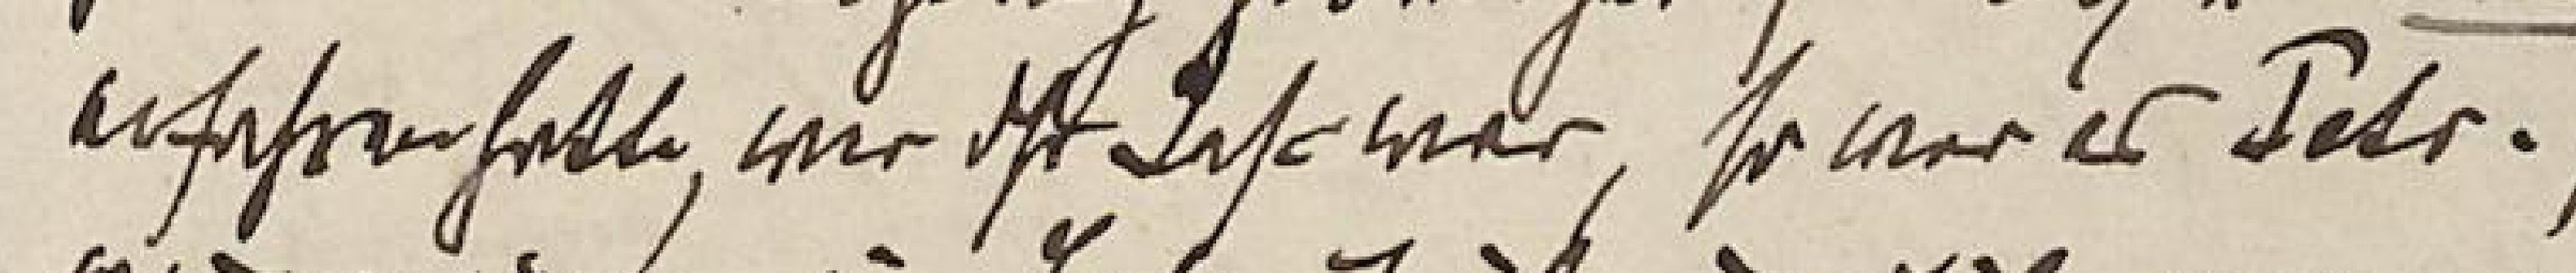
erfahren hatte, wer dsr Jes. war, so war es Petr.,
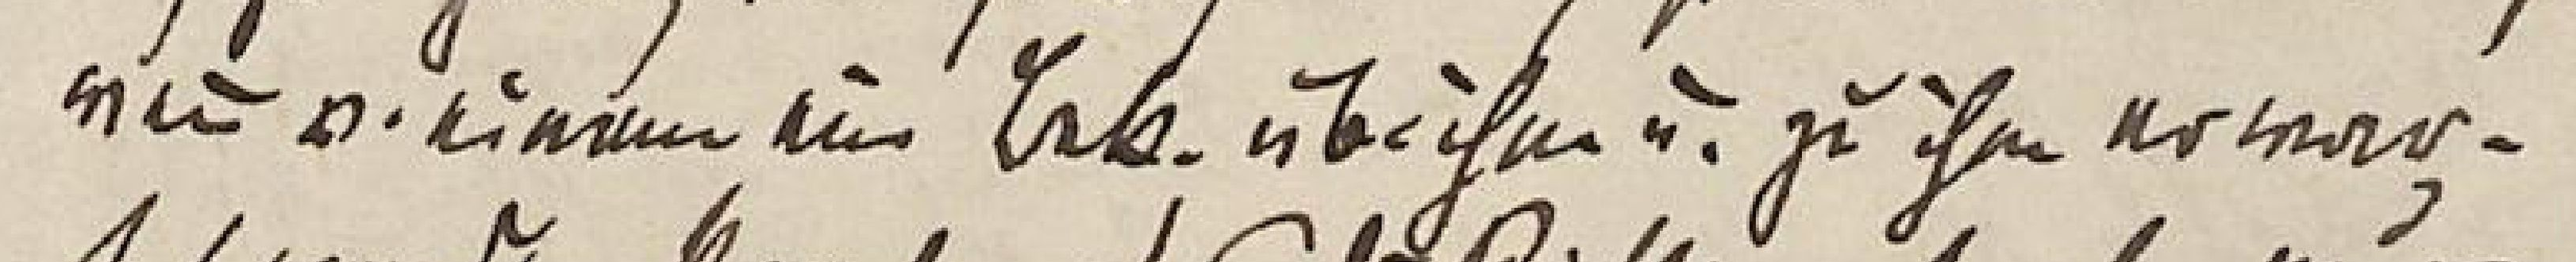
wen v. einem ein Bek. üb. ihn u. zu ihm erwar¬
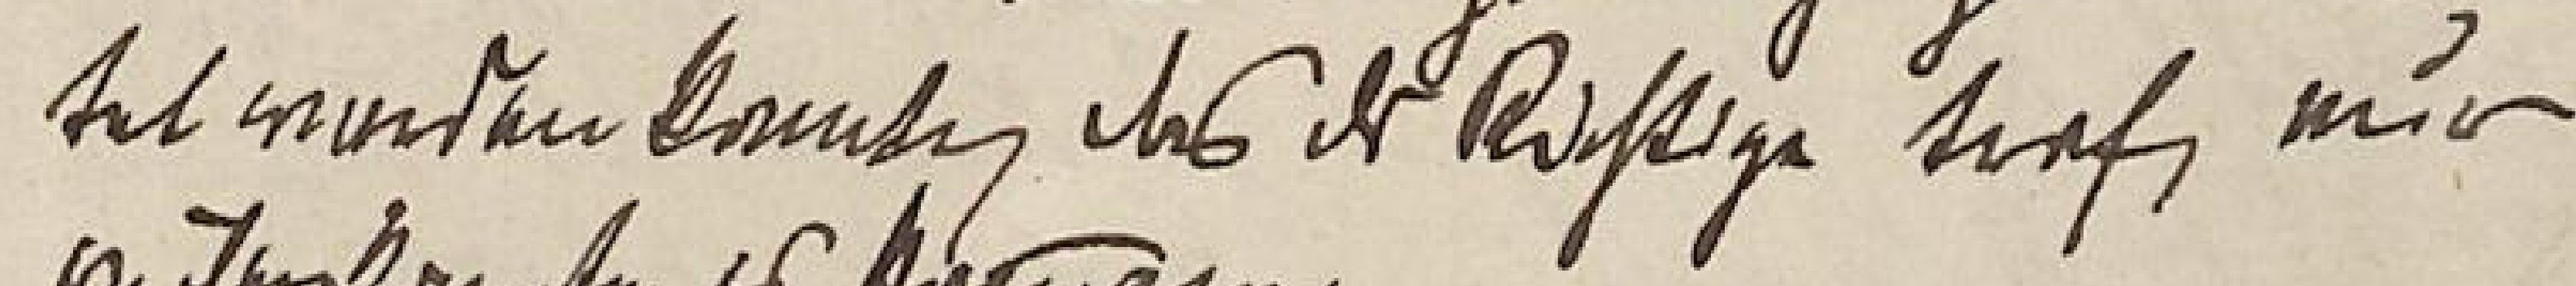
tet werden konnte, das dr. Richtige traf, nur
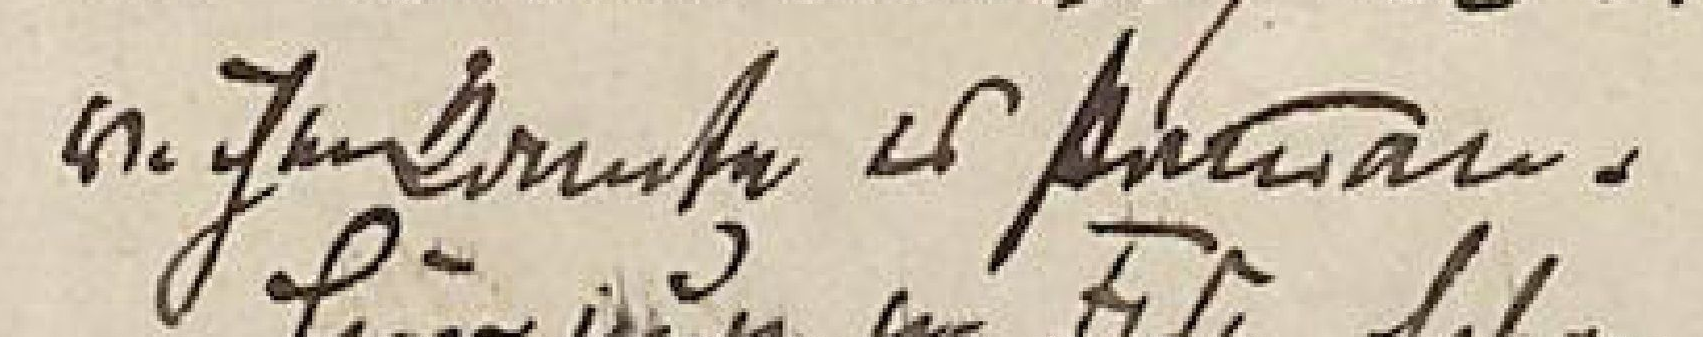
v. ihm konnte es komen.
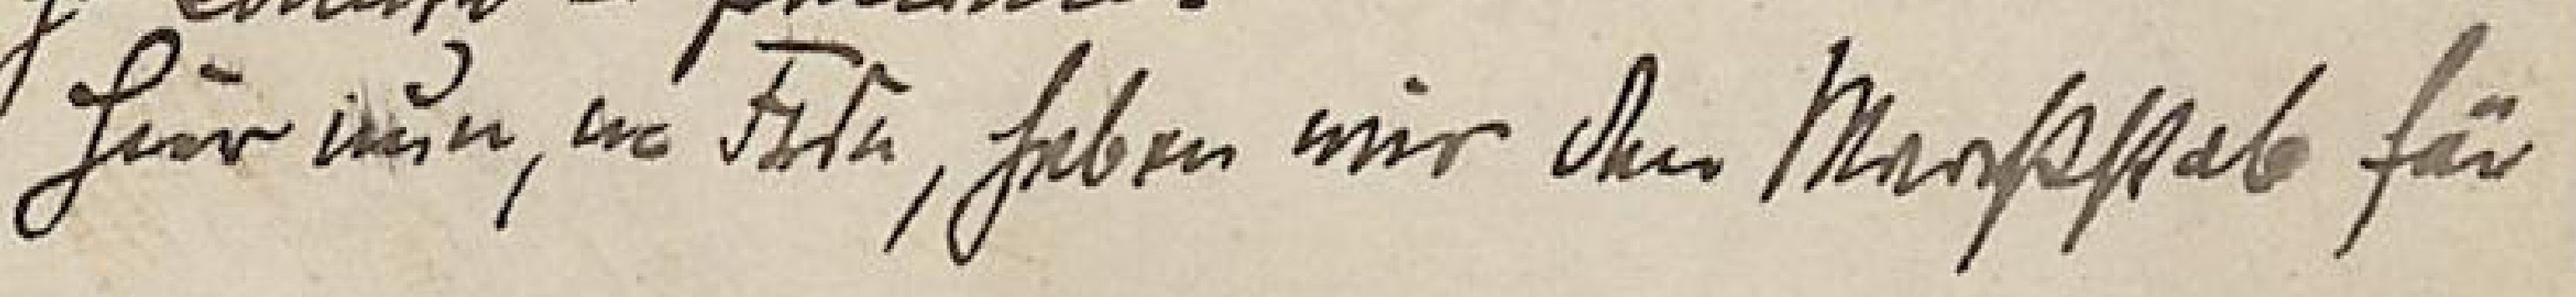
Hier nun, m. Frde, haben wir den Maaßstab für
